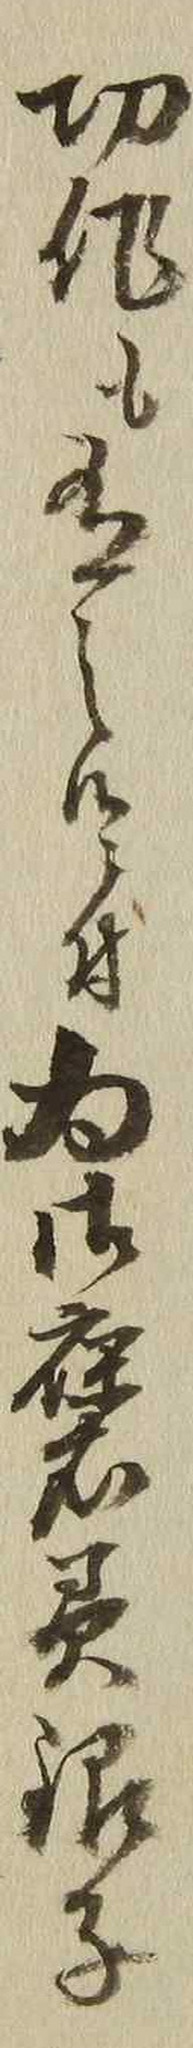功作も有之候ニ付為御褒美銀子
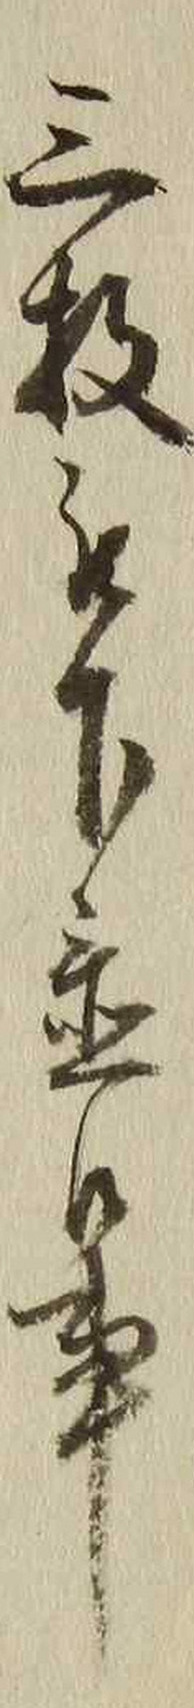三枚被下置候事
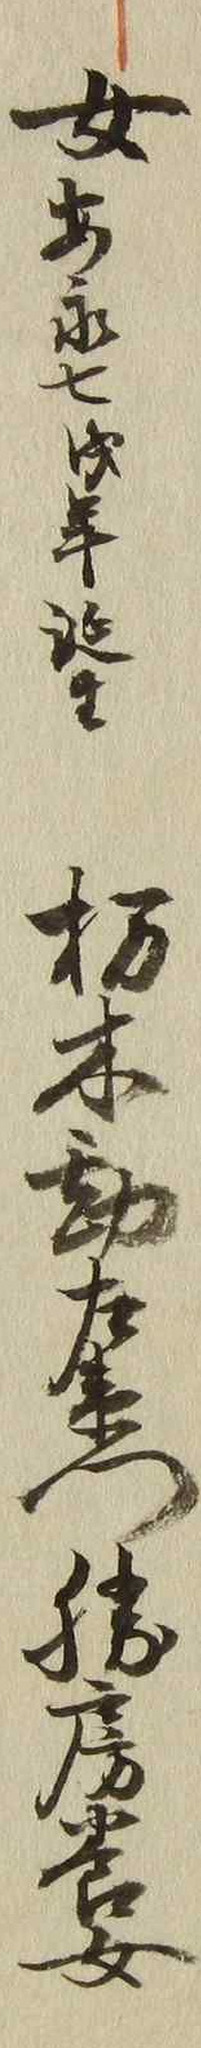女安永七戌年誕生栃木勘左衛門勝房養女
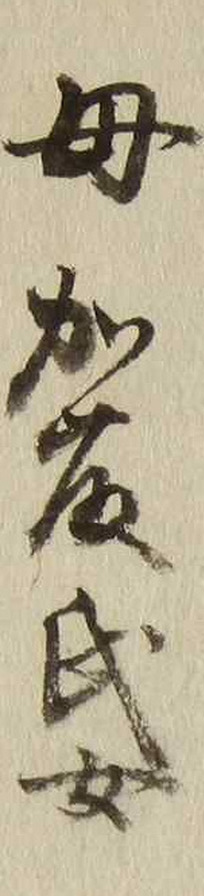母加藤氏女

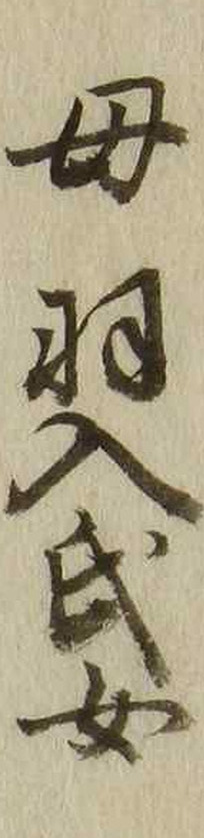母羽入氏女
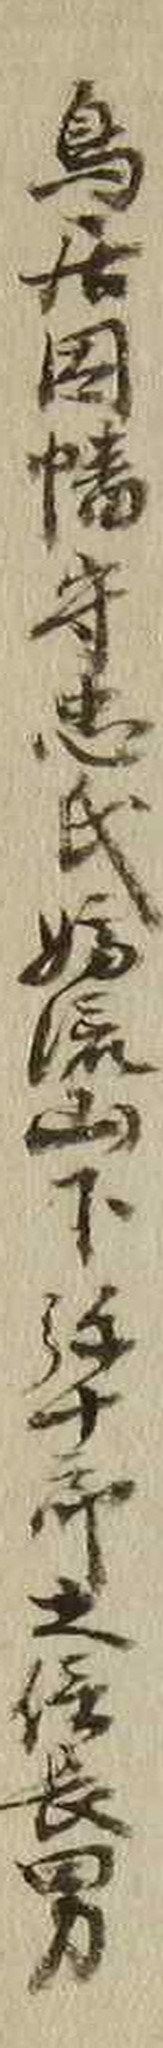鳥居因幡守忠氏嫡流山下弥十郎之信長男
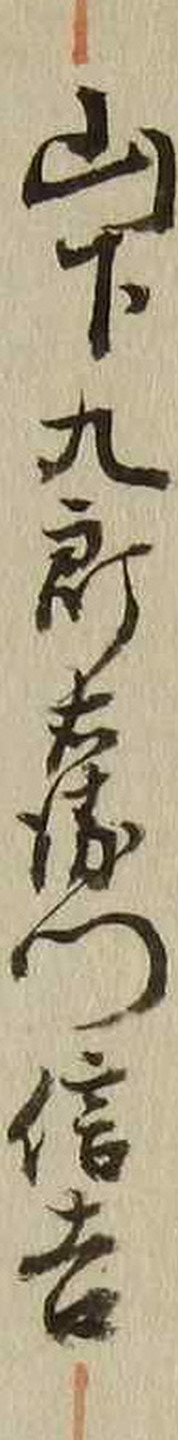山下九郎右衛門信吉
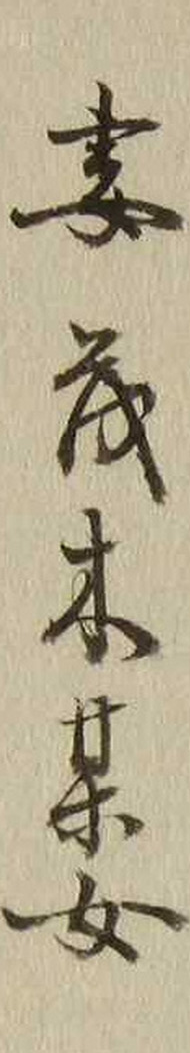妻茂木某女
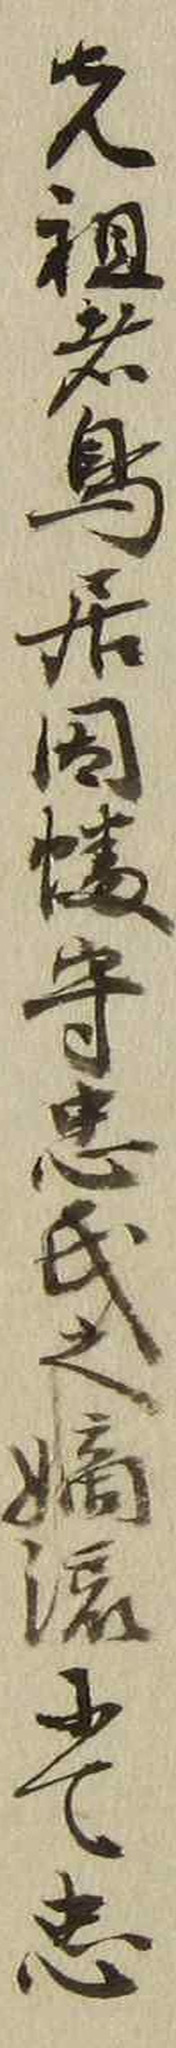先祖者鳥居因幡守忠氏之嫡流にて忠
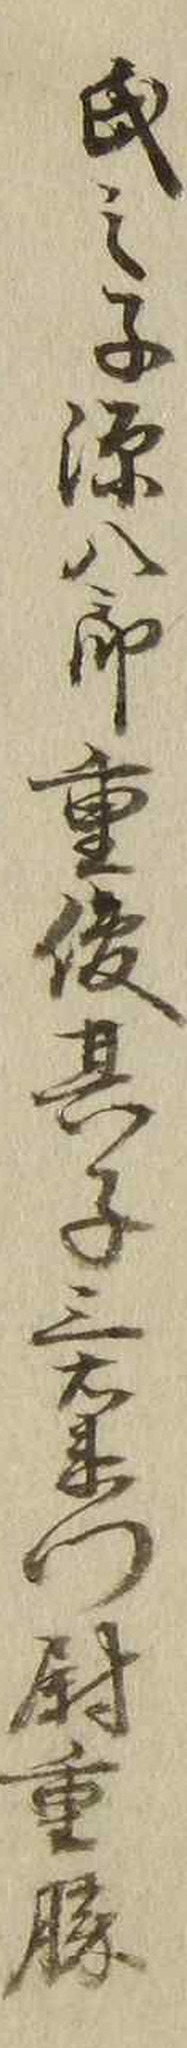氏之子源八郎重俊其子三右衛門尉重勝

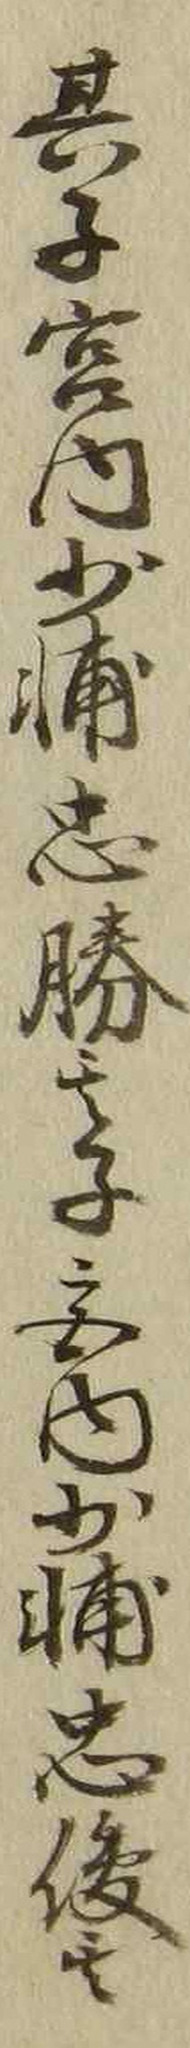其子宮内少輔忠勝其子宮内少輔忠俊其
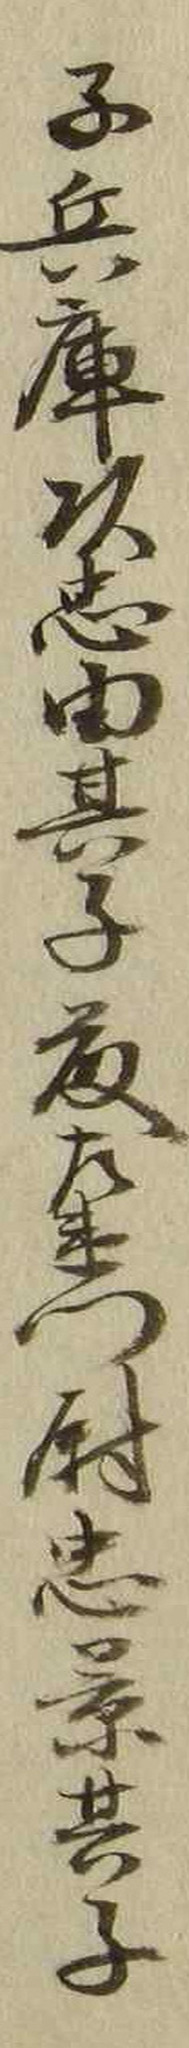子兵庫頭忠由其子藤左衛門尉忠景其子
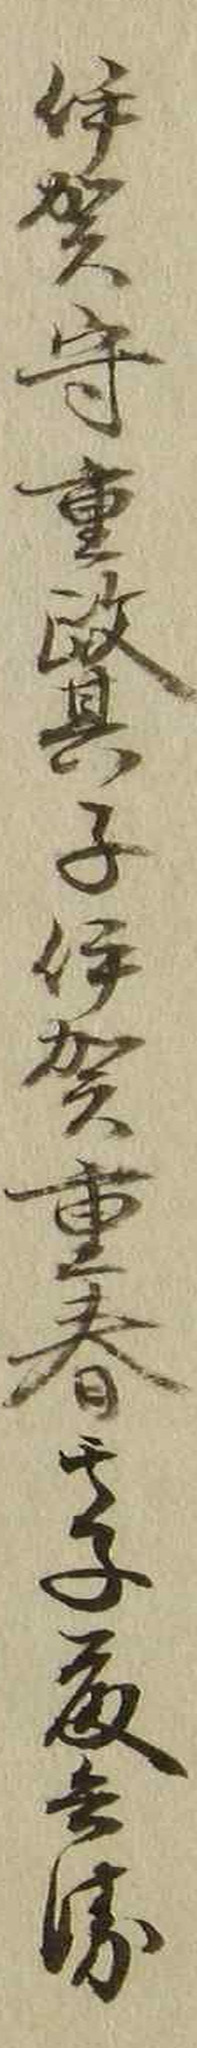伊賀守しｇ重政其子伊賀重春其子藤兵衛
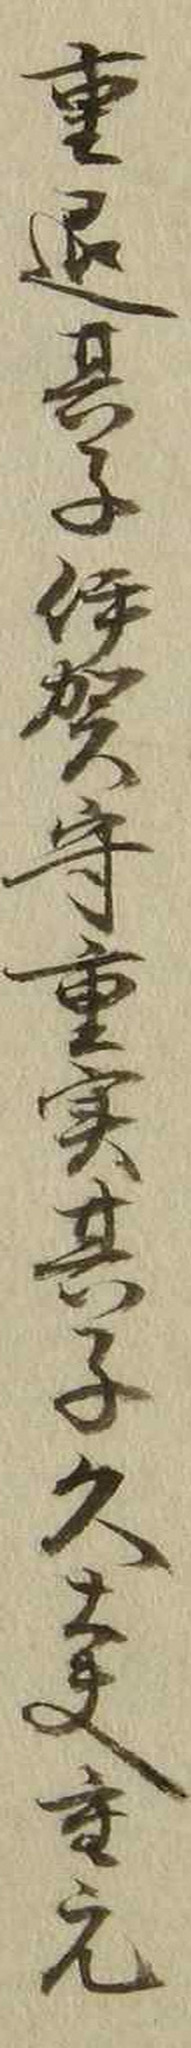重退其子伊賀守重実其子久太夫重元
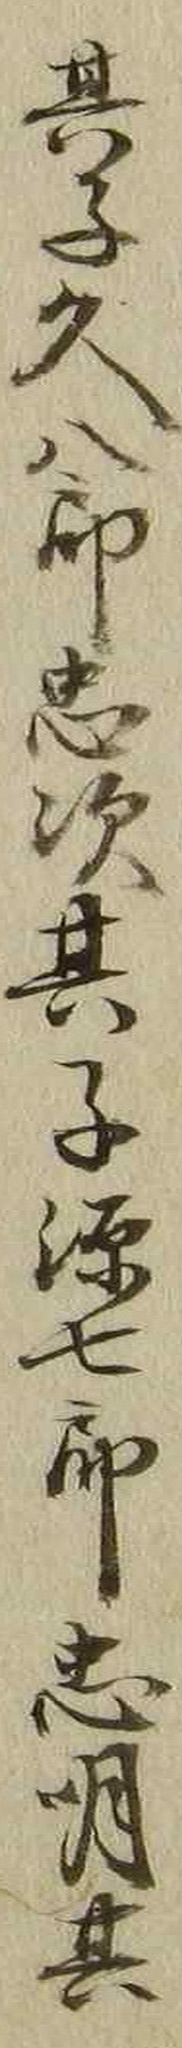其子久八郎忠次其子源七郎忠明其
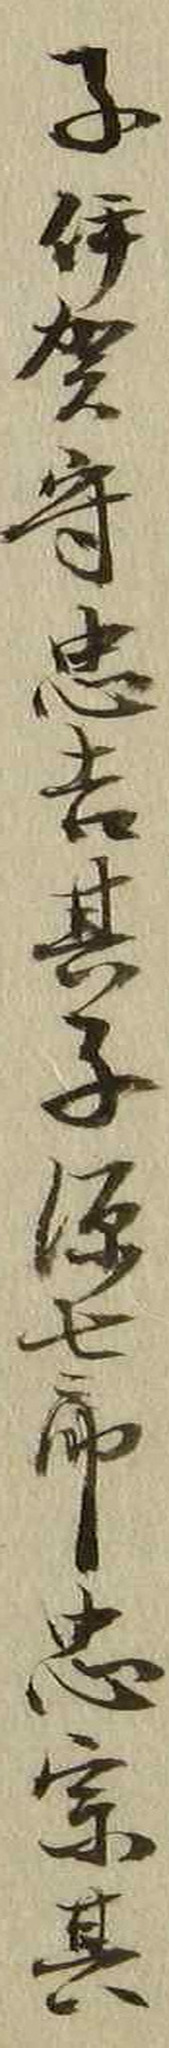子伊賀守忠吉其子源七郎忠宗其
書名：諸士系譜　巻之64　と之部7
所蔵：会津若松市立会津図書館
